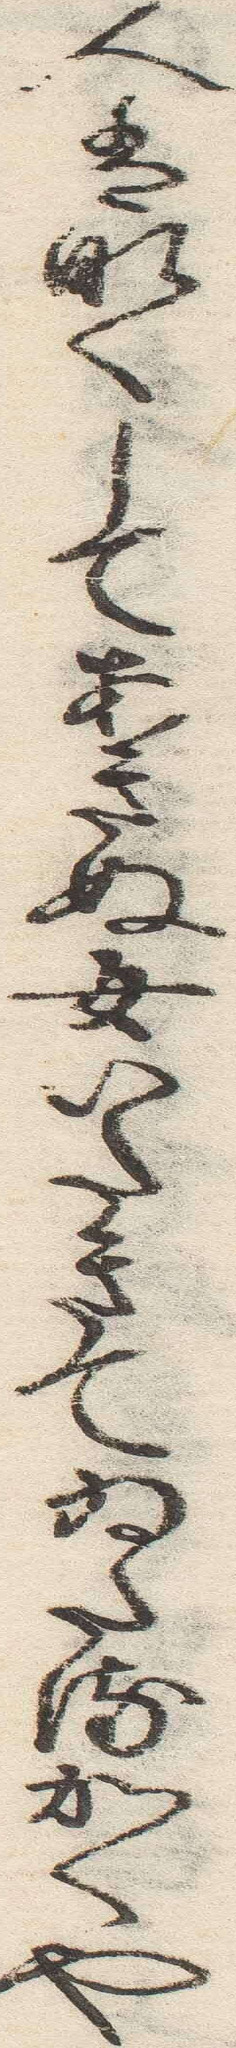人はなくしてあきぬ女いたきてゐたるかくや
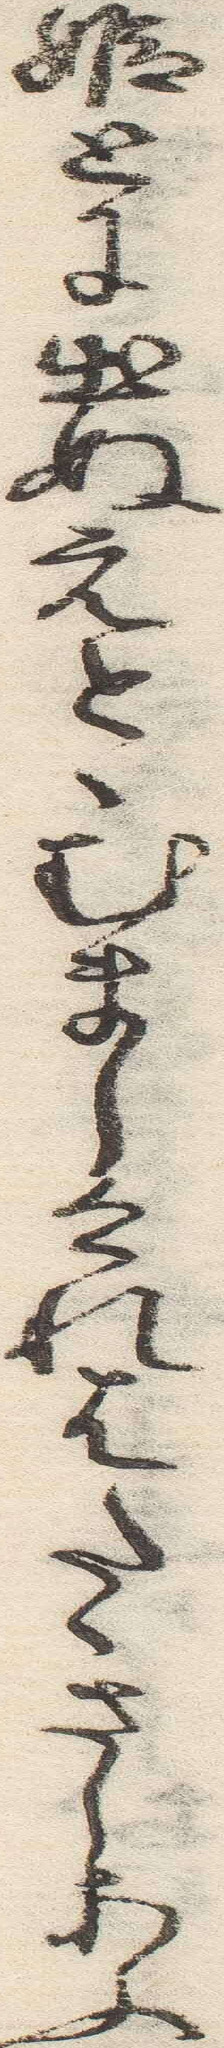姫とに出ぬえとゝむましけれはたゝさしあふ
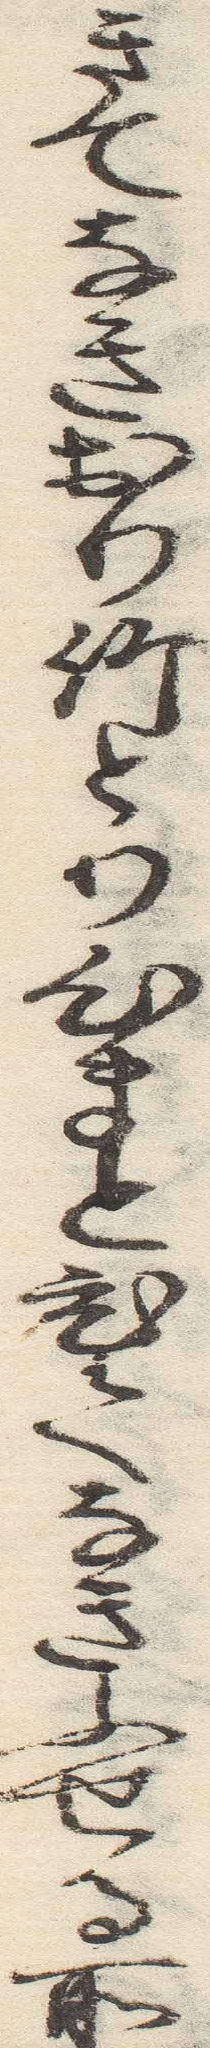きてなきおり竹とり心まとひてなきふせる所
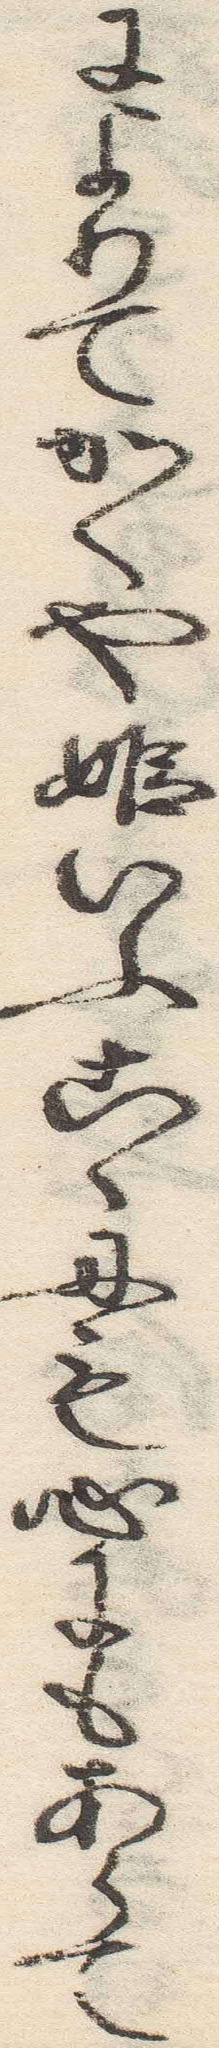によりてかくや姫いふこゝにも心にもあらて
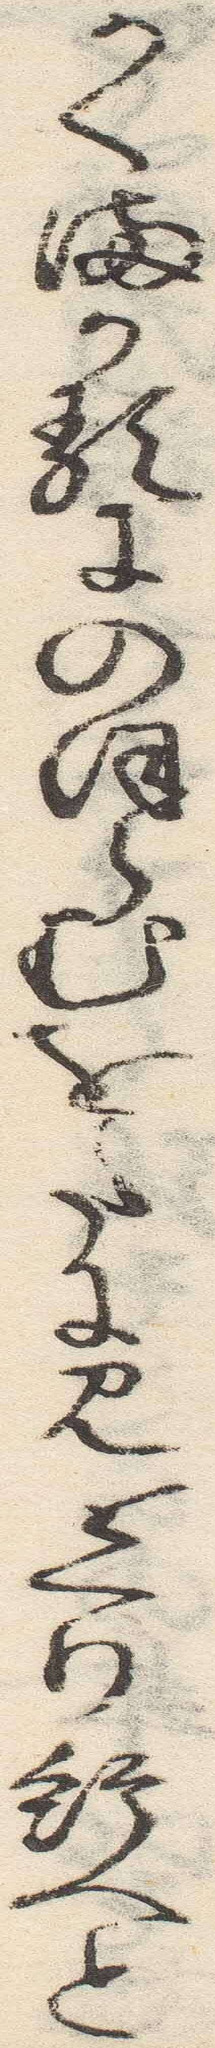かくまかるにのほらむをたに見をくり給へと
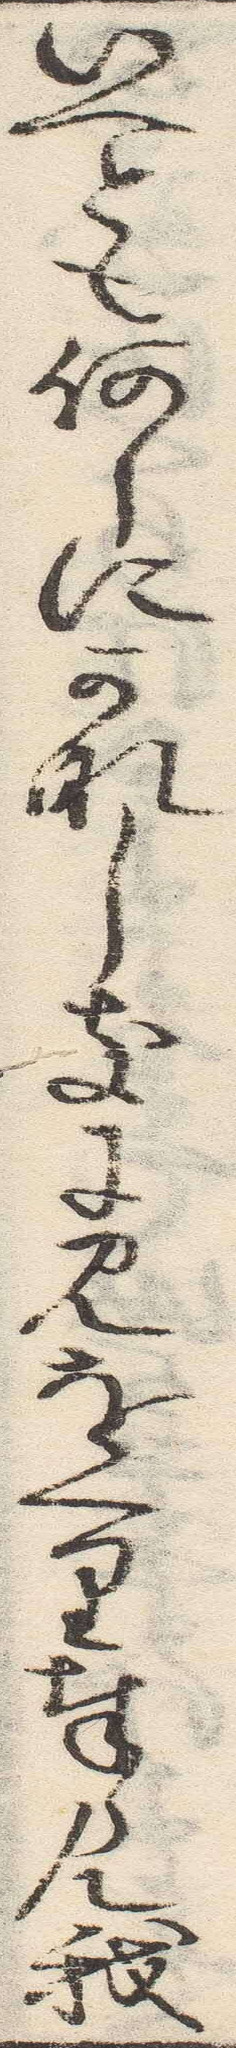いへとも何しにかなしきに見をくり奉らん我
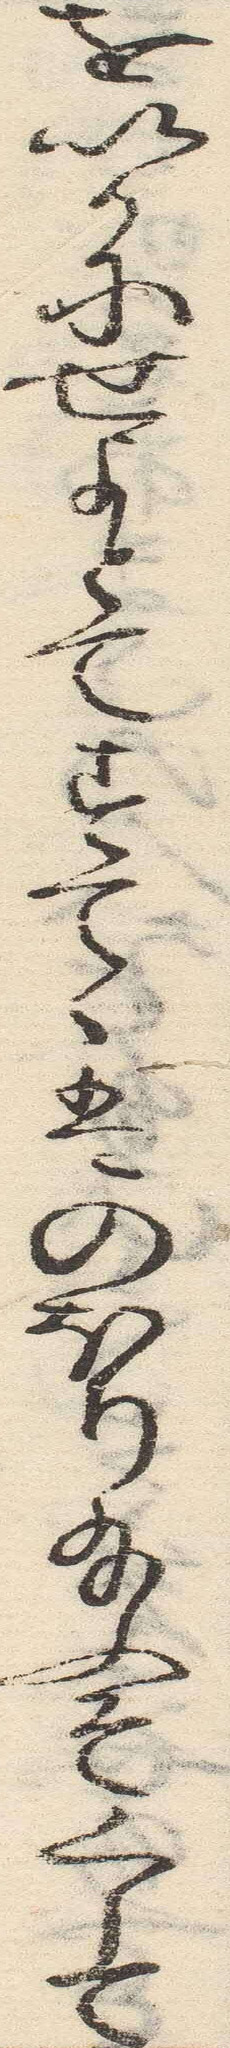をいかにせよとてすてゝはのほり給ふそくして
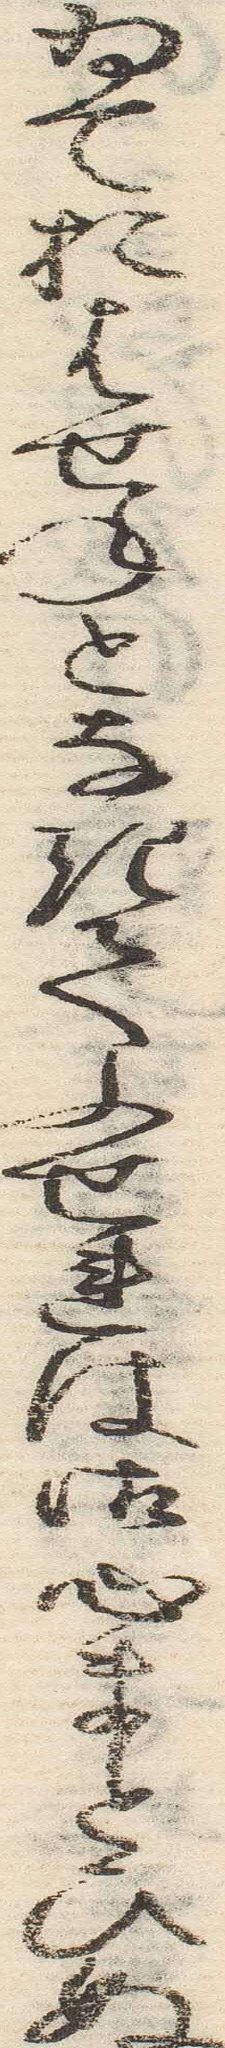ゐておはせねとなきてふせれは御心まとひぬ
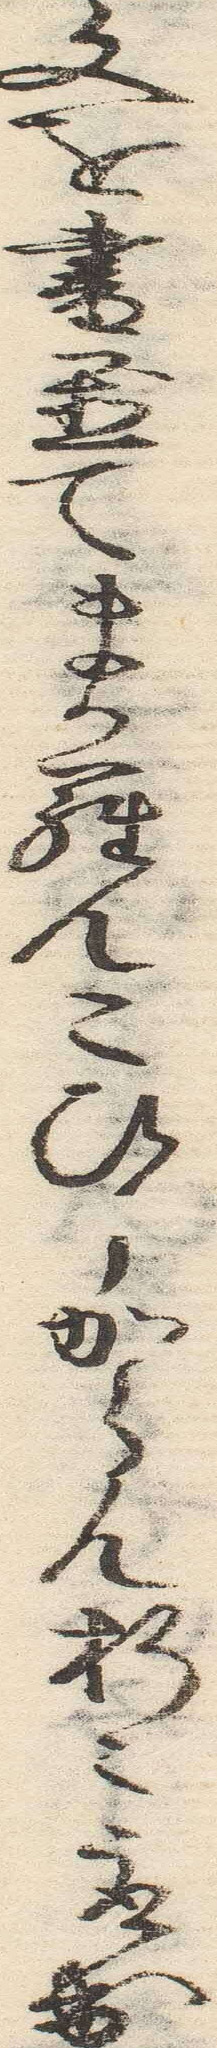文を書置てまからんこひしからん折々取出
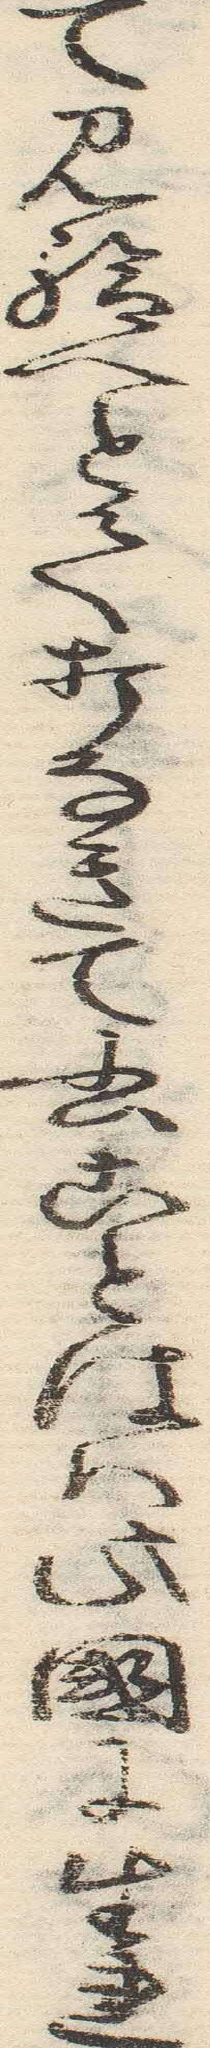て見給へとて打なきて書ことは此国に生れ
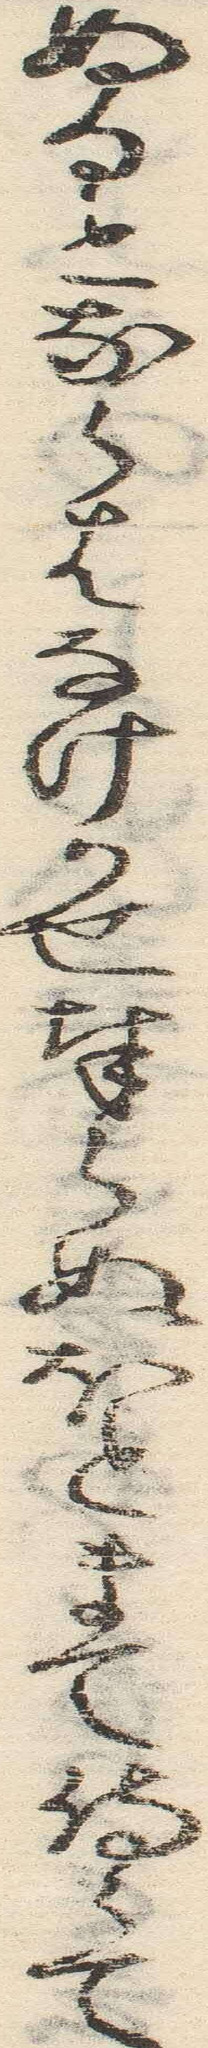ぬるとならはなけかせ奉らぬほとまて侍らて
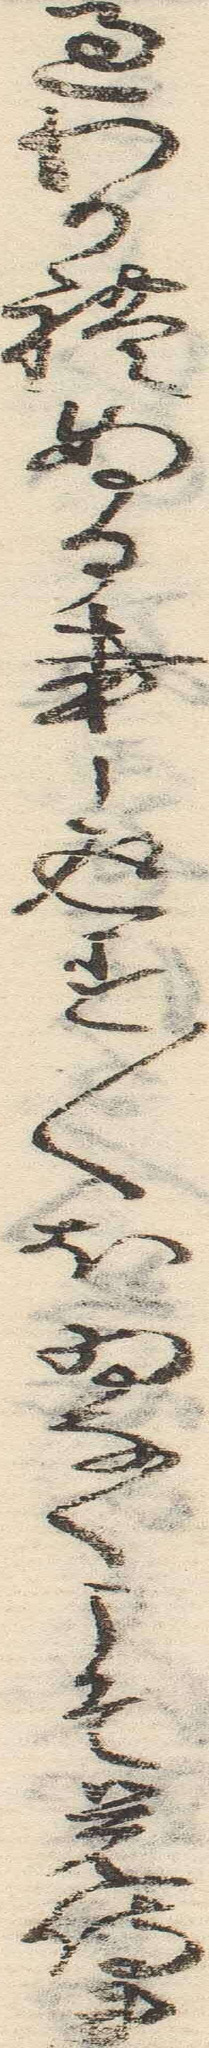過わかれぬる事返す〳〵ほゐなくこそ覚侍れ
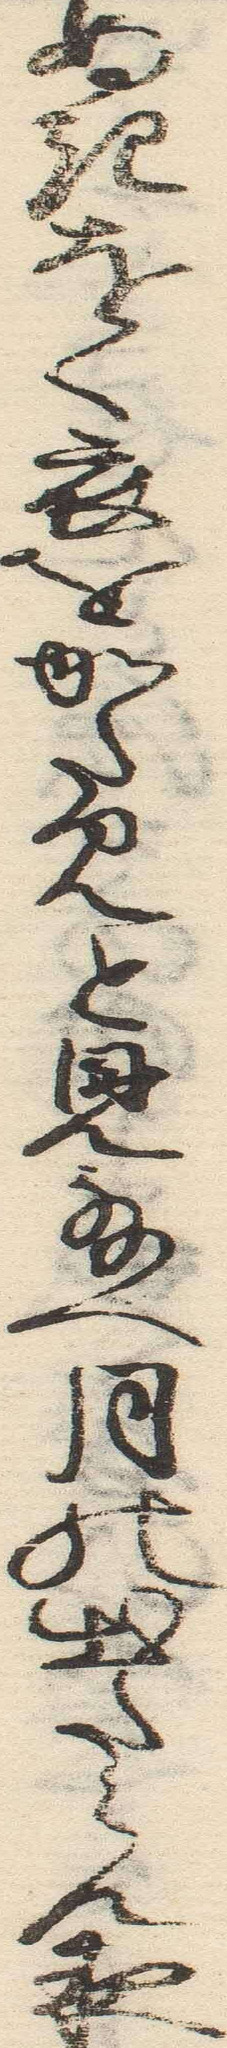ぬきをく衣をかたみと見給へ月の出たらん夜
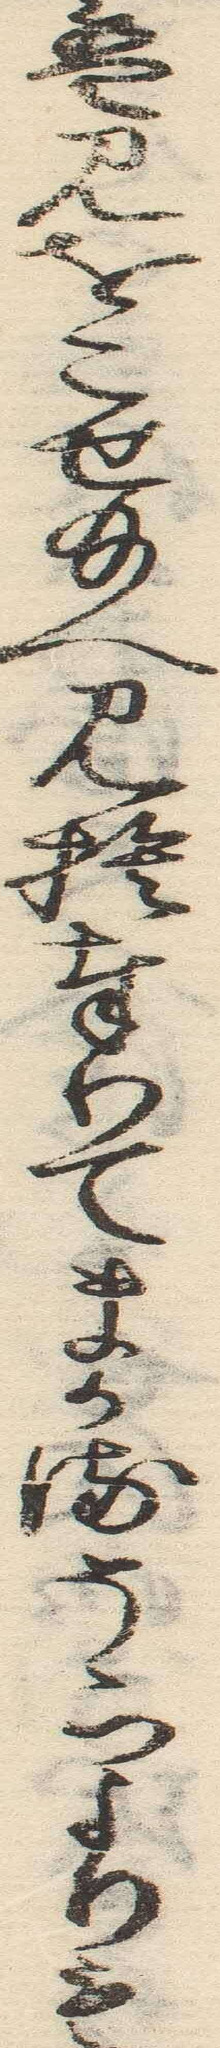は見をこせ給へ見捨奉りてまかるそらよりも
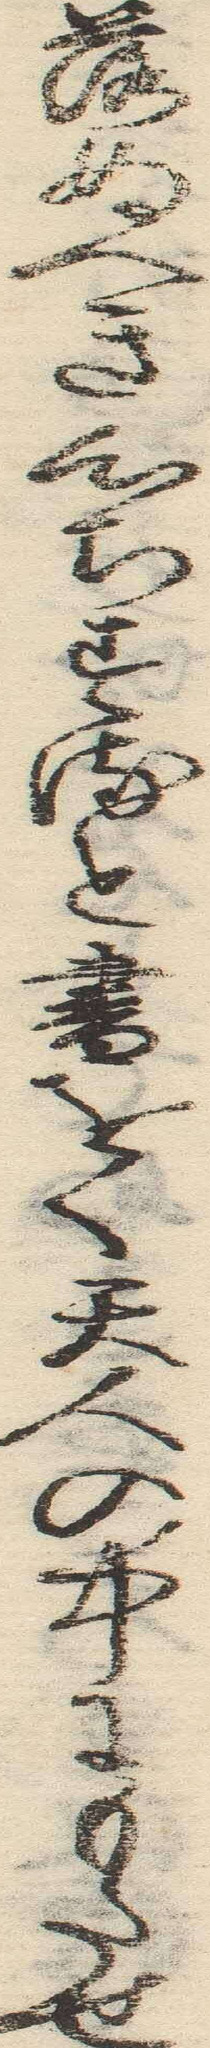落ぬへき心ちすると書をく天人の中にもたせ
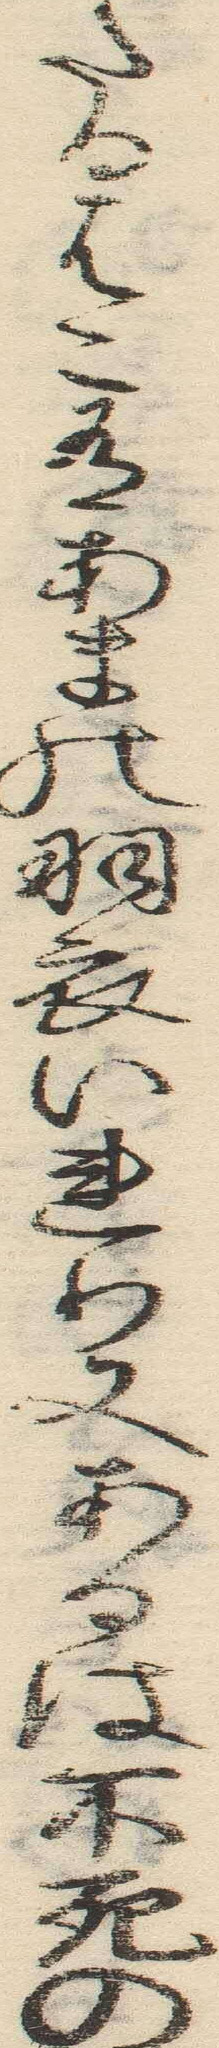たるはこ有あまの羽衣いれり又あるは不死の
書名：竹取物語
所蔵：東京学芸大学附属図書館 国文学研究資料館
